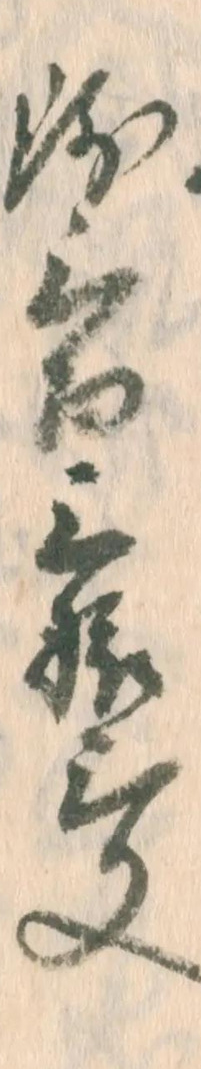銭三百三拾三文
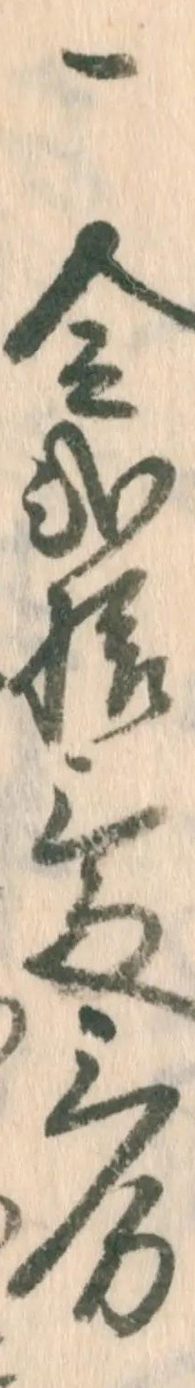一金弐拾三両三分
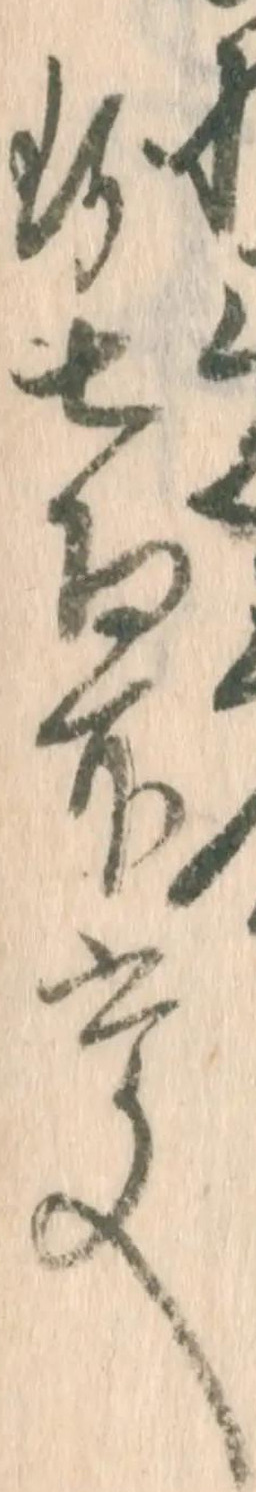銭七百廿六文

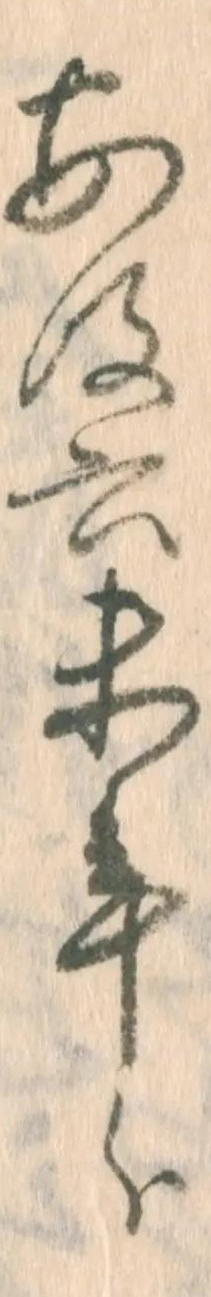安政六未年分
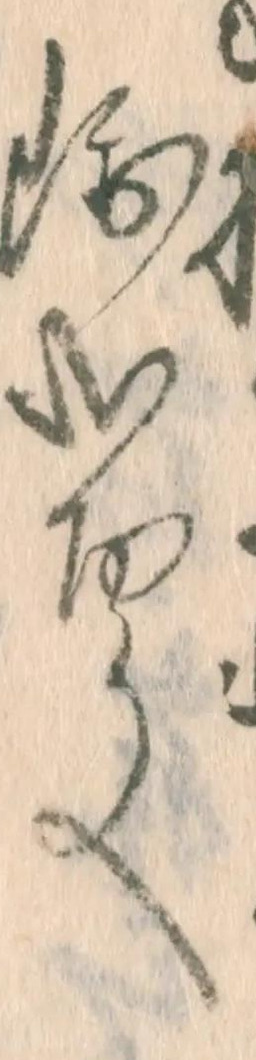銭弐百文
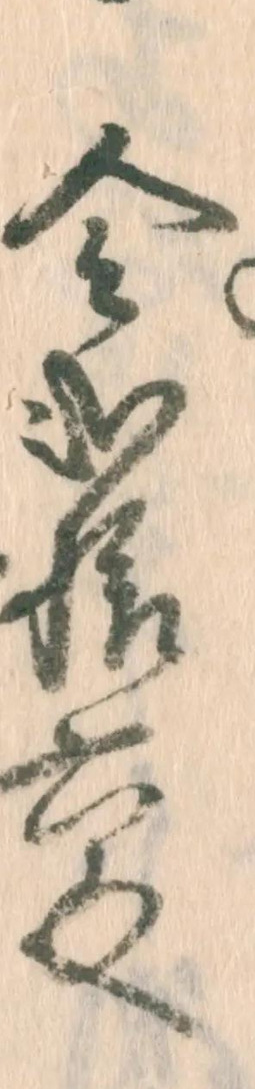一金弐拾六両
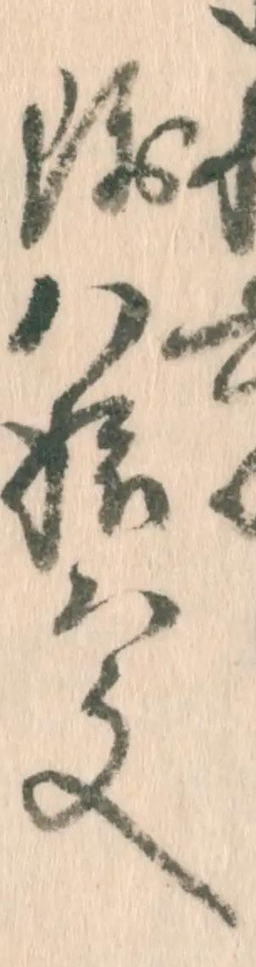銭八拾八文
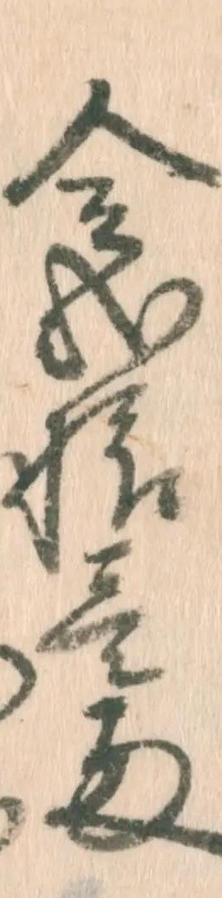一金弐拾壱両
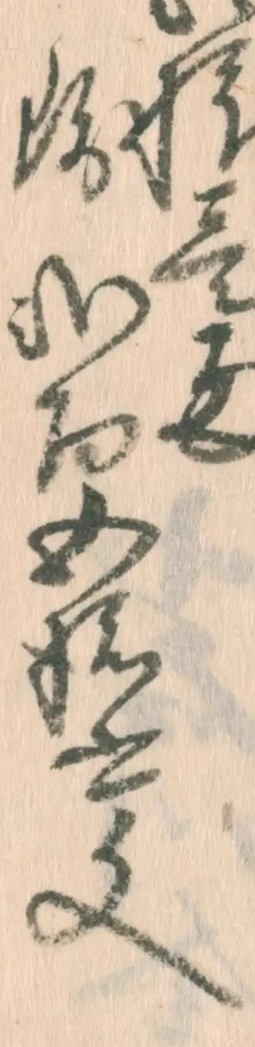銭弐百五拾六文
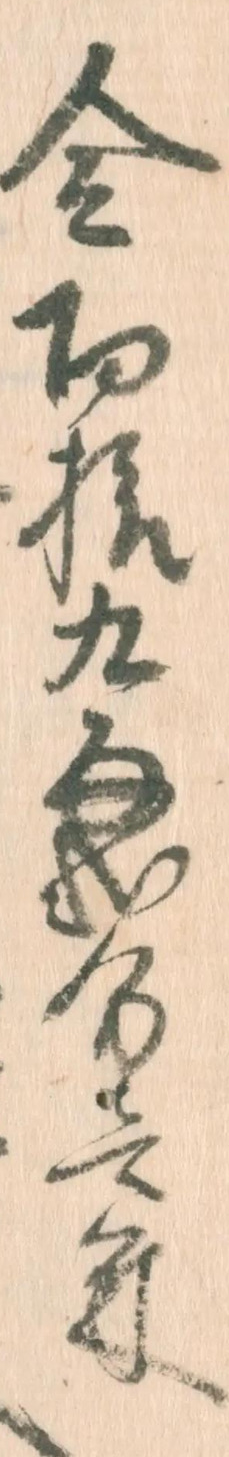金百拾九両弐分壱朱
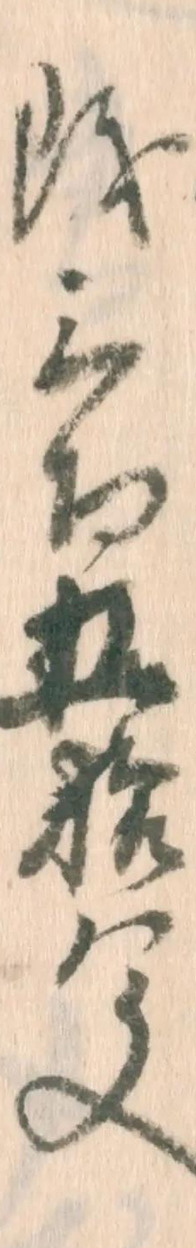銭三百五拾八文
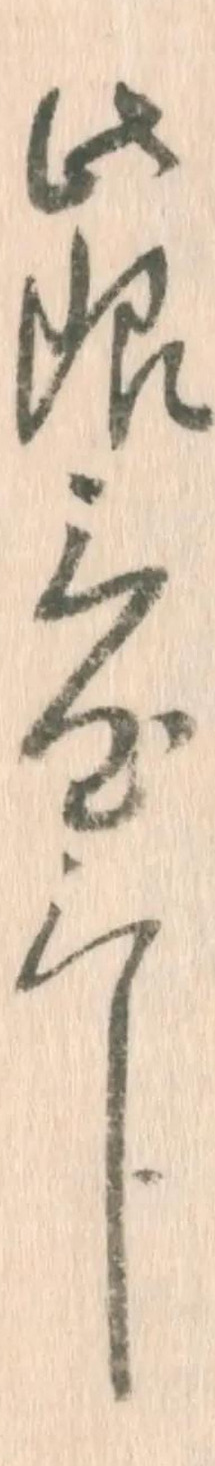此銀三匁三分
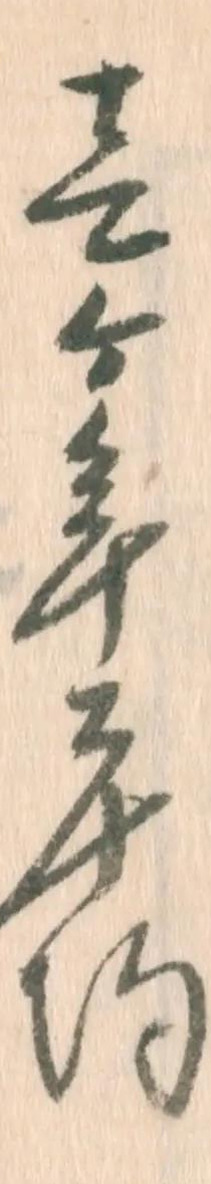壱ヶ年平均
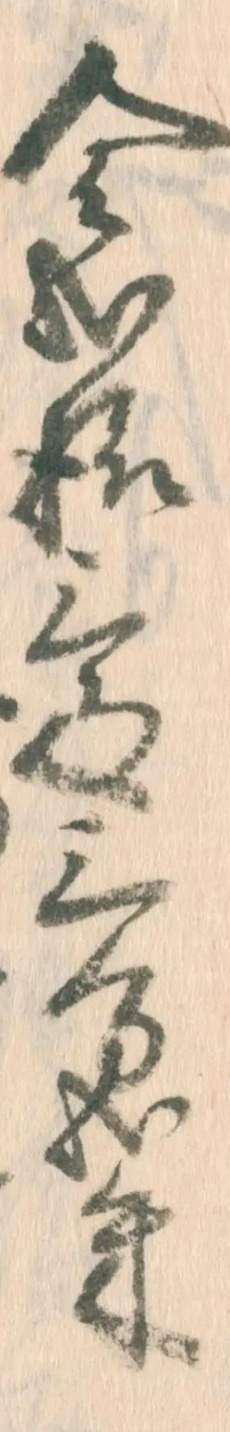金弐拾三両三分弐朱
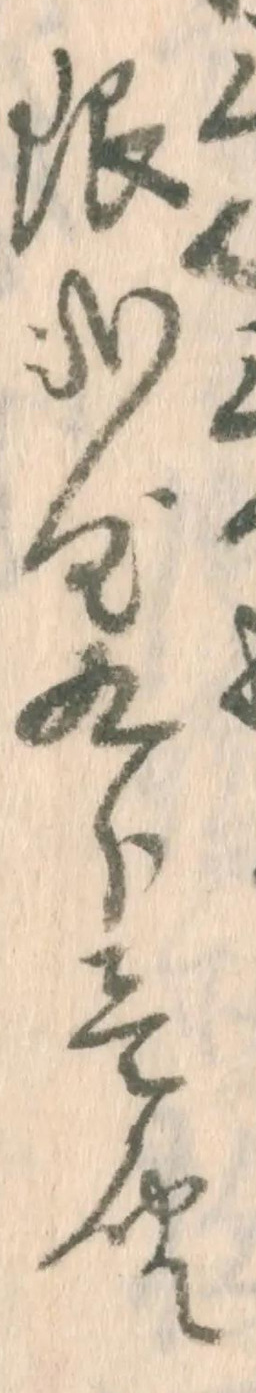銀弐匁九分壱厘

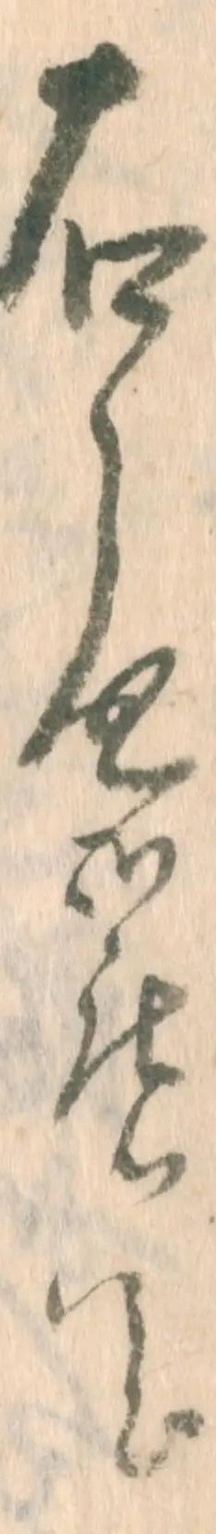右之通御座候以上
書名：地震災書留 2巻. [1] 内表紙に「地震災書留　安政二卯年　但本所深川御用屋敷地代免除調」とあり
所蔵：国立国会図書館 National Diet Library, JAPAN
